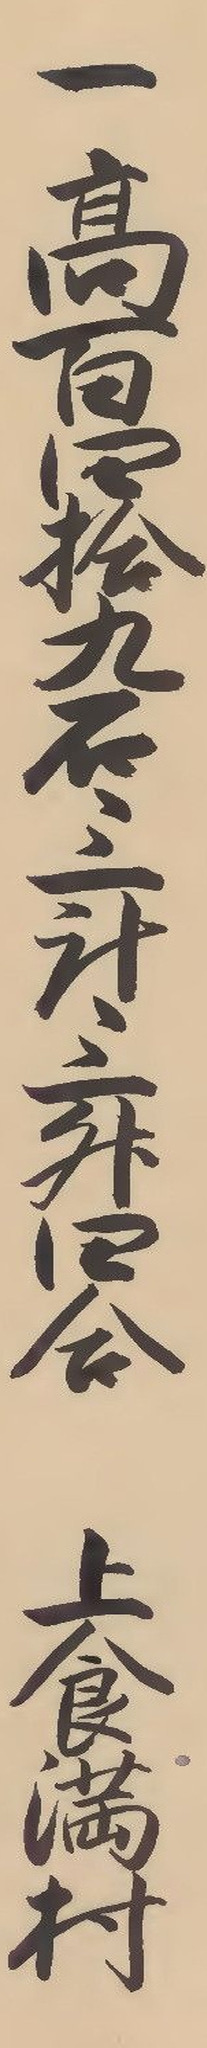一高百四拾九石三斗三升四合上食満村
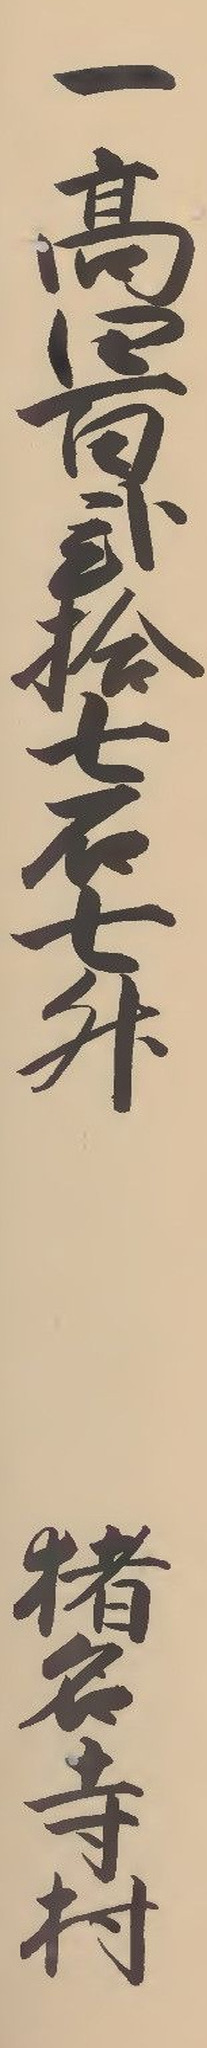一高四百弐拾七石七升猪名寺村
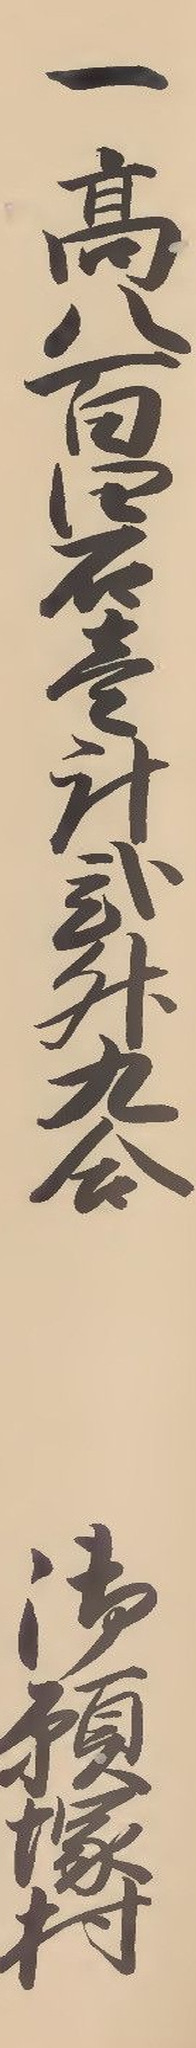一高八百四石壱斗弐升九合御願塚村
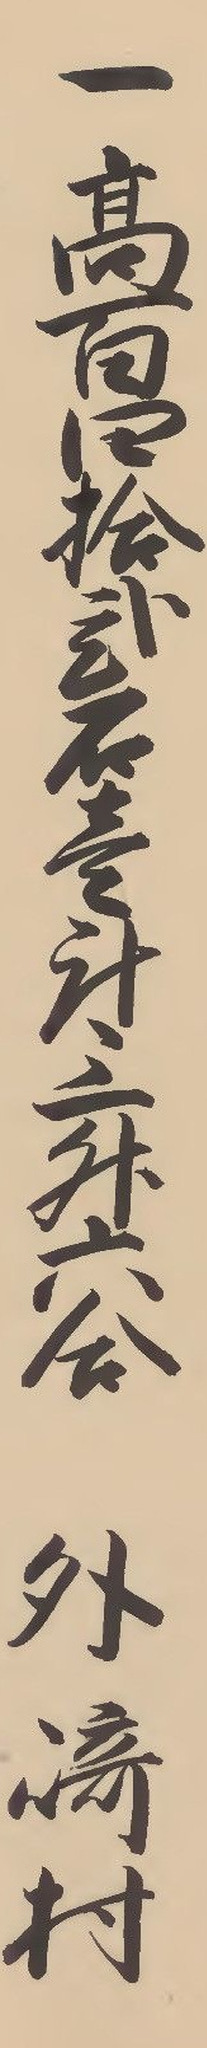一高百四拾弐石壱斗三升六合外崎村
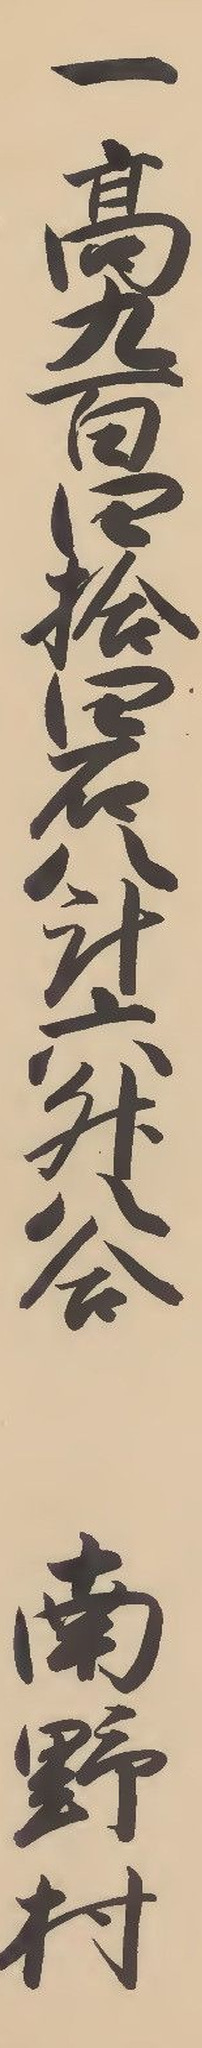一高九百四拾四石八斗六升八合南野村
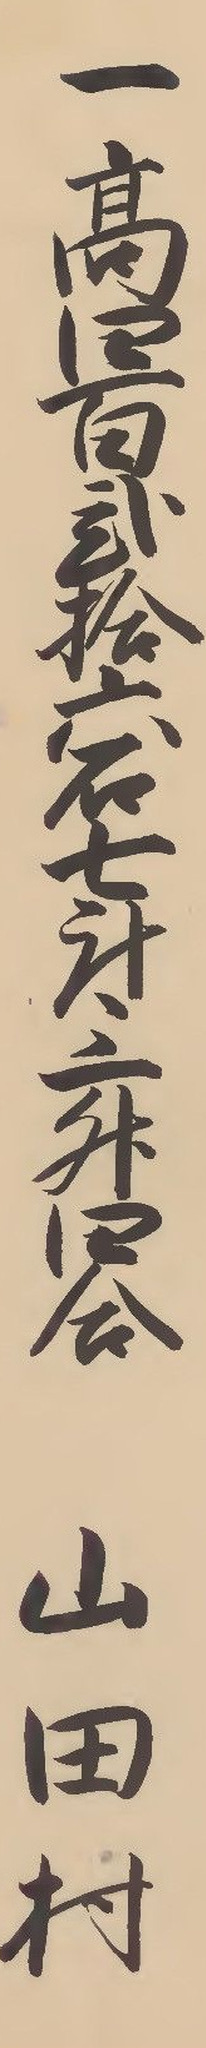一高四百弐拾六石七斗三升四合山田村

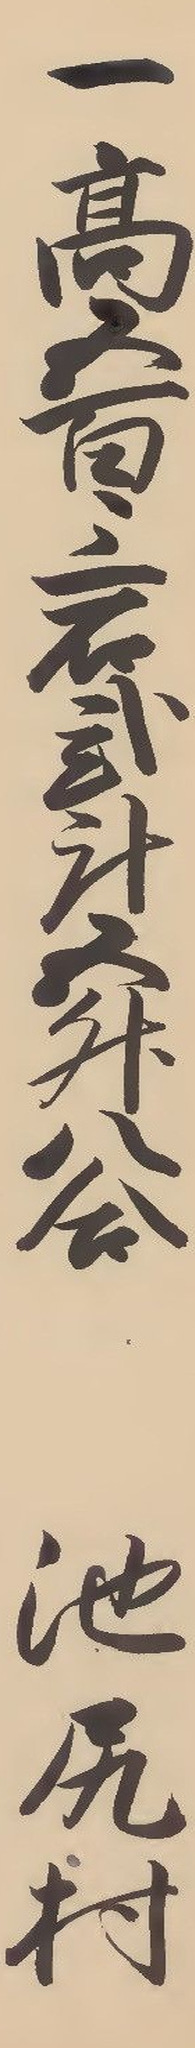一高五百三石弐斗五升八合池尻村
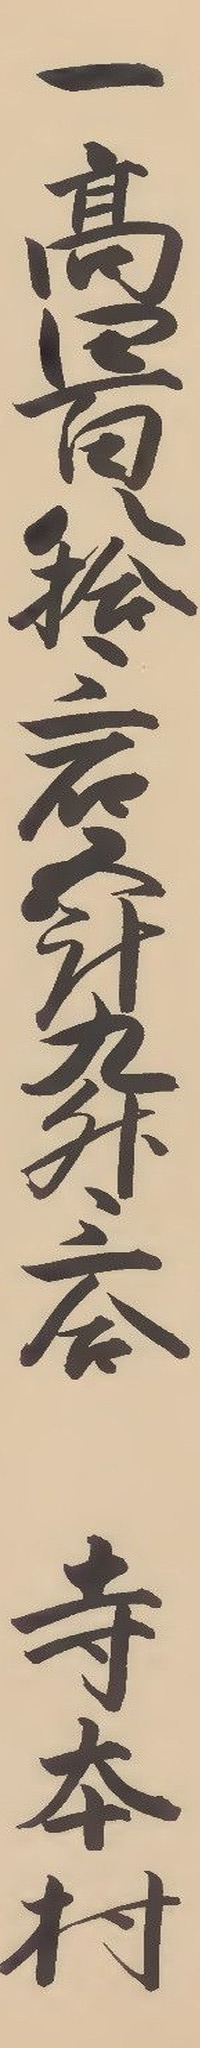一高四百八拾三石五斗九升三合寺本村
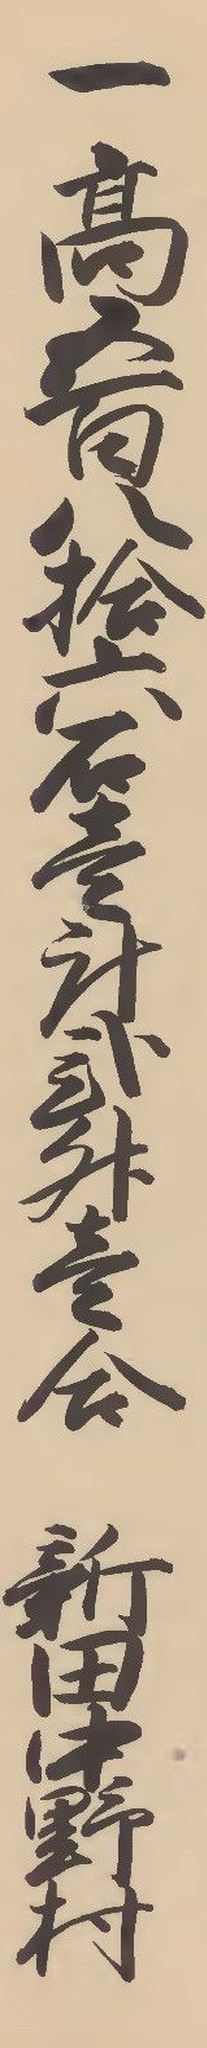一高五百八拾六石壱斗弐升壱合新田中野村
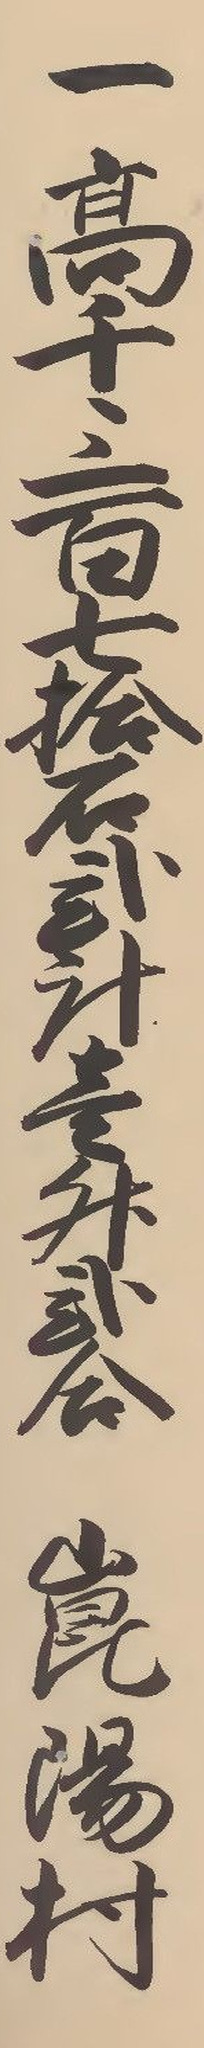一高千三百七拾石弐斗壱升弐合崑陽村
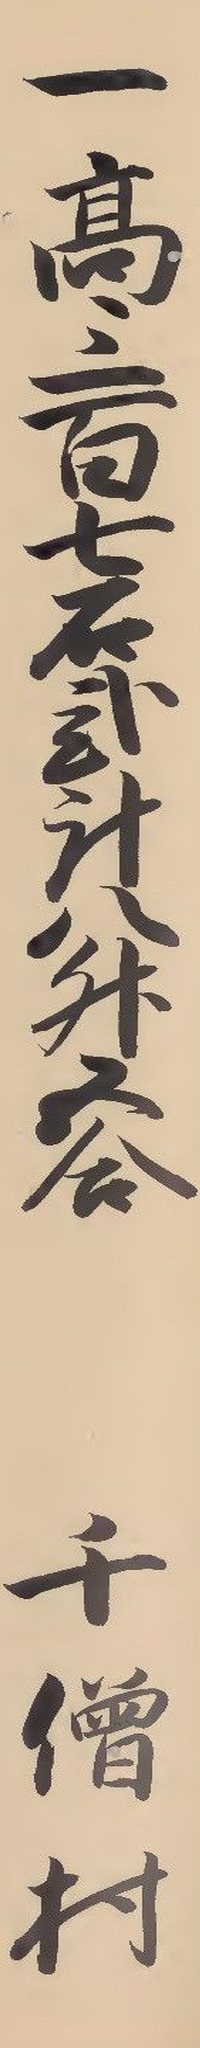一高三百七石弐斗八升五合千僧村
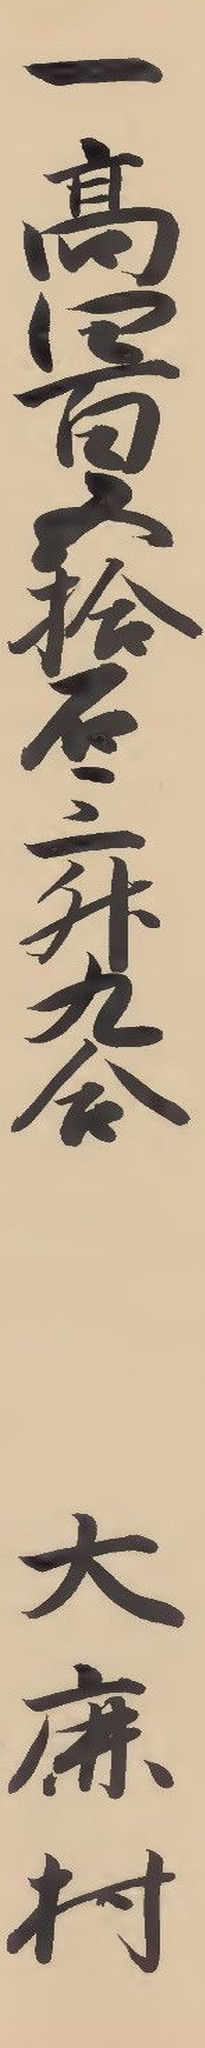一高四百五拾石三升九合大鹿村
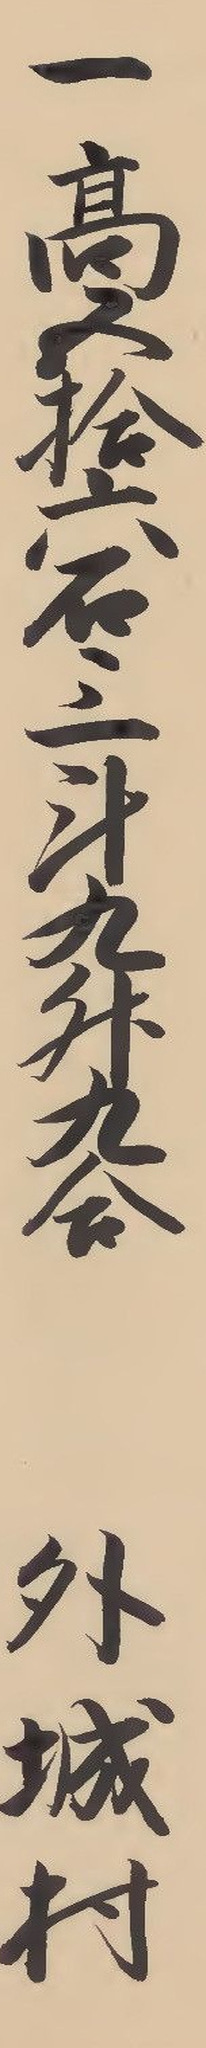一高五拾六石三斗九升九合外城村
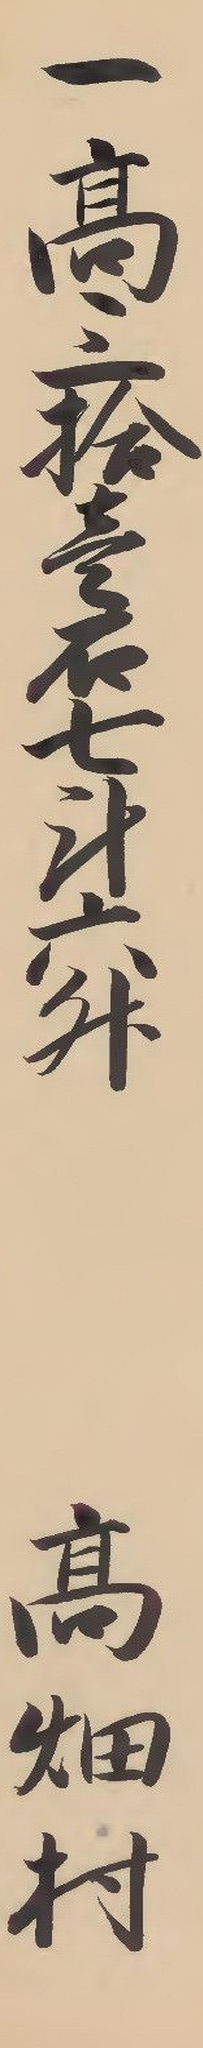一高三拾壱石七斗六升高畑村

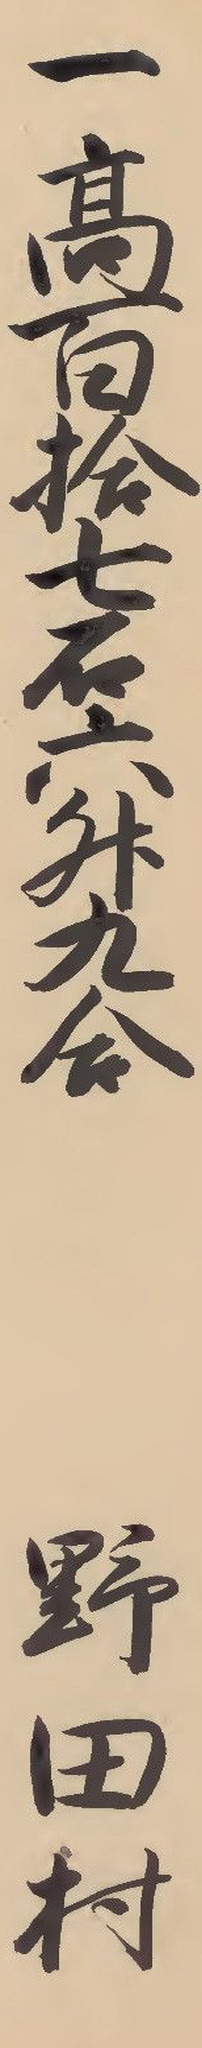一高百拾七石六升九合野田村
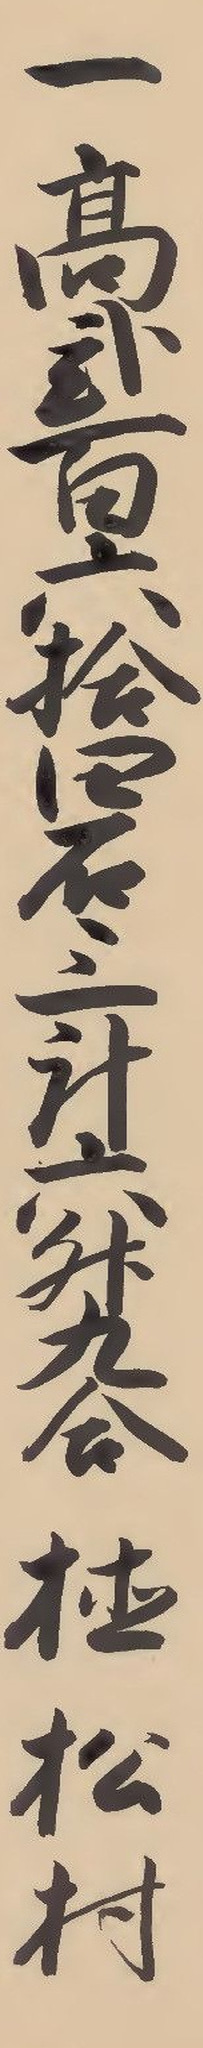一高弐百六拾四石三斗六升九合植松村
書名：摂津国郷帳
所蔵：国立公文書館 National Archives of Japan
